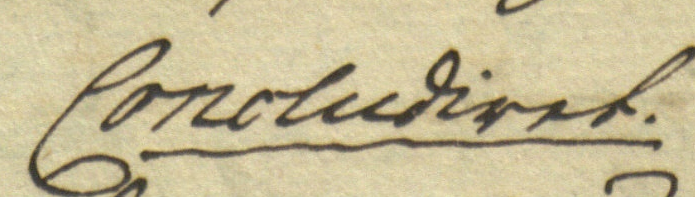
Concludiret.
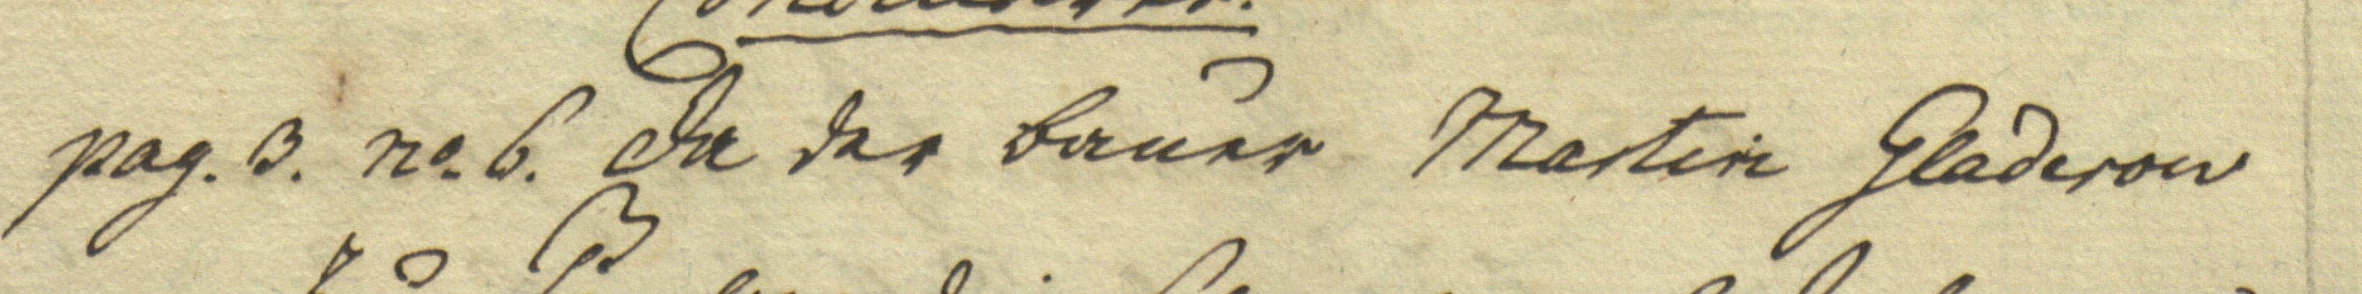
pag. 3. No 6. Da der Bauer Martin Gladerow
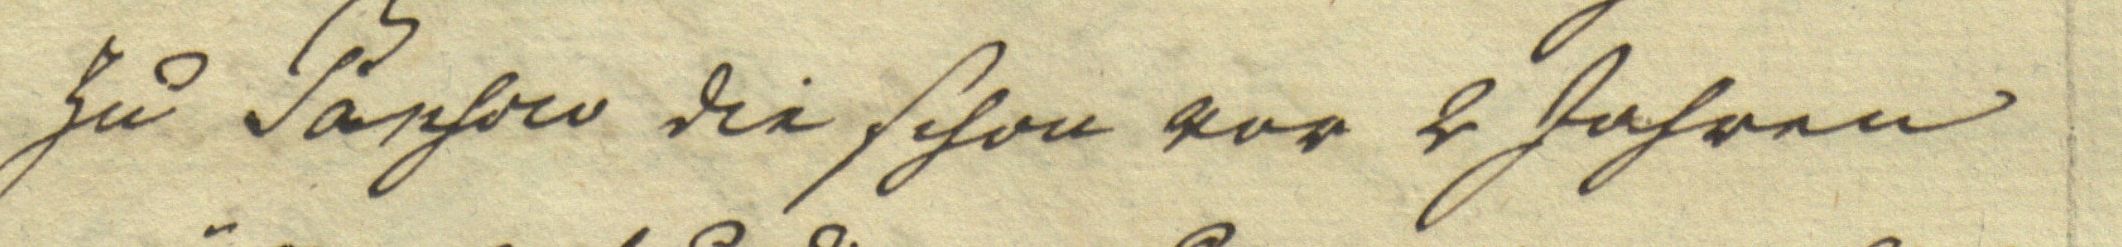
zu Pansow die schon vor 2 Jahren
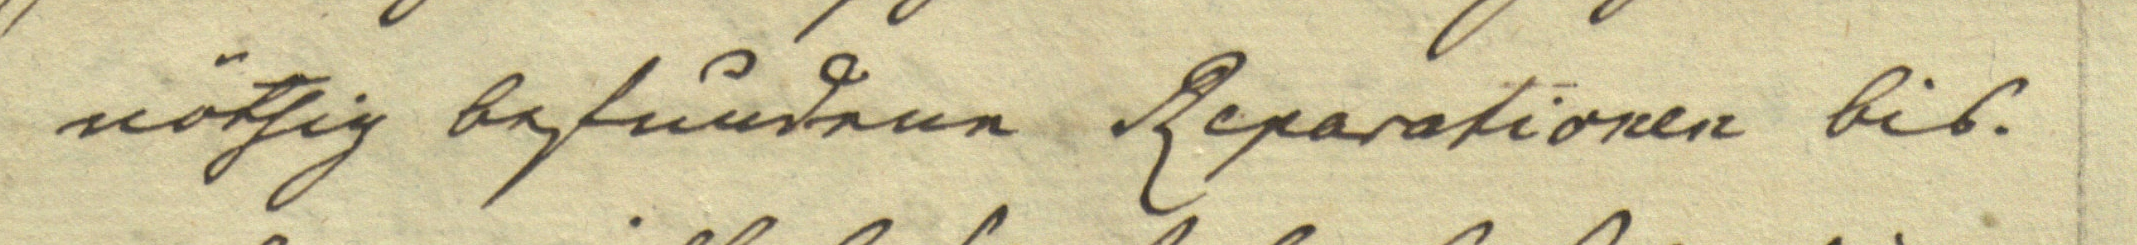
nöthig befundene Reparationen bis¬
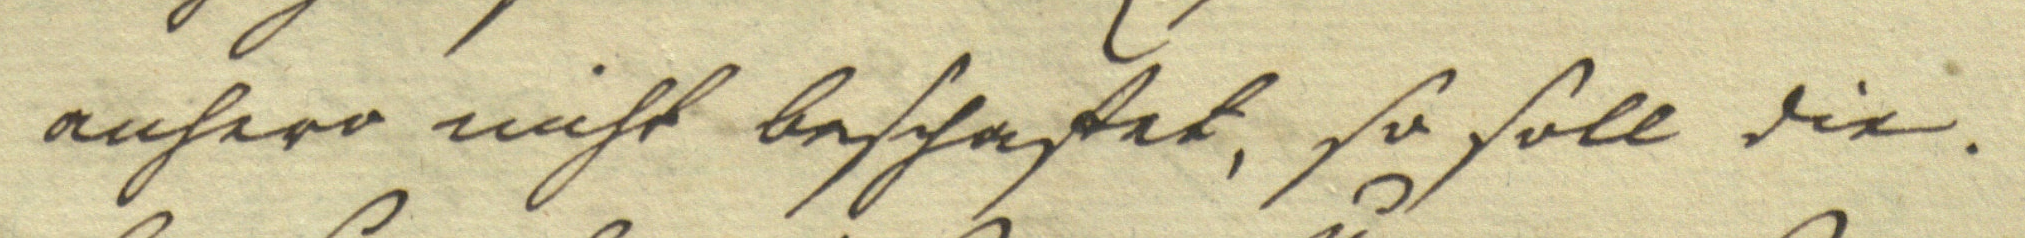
anhero nicht beschaffet, so soll die¬
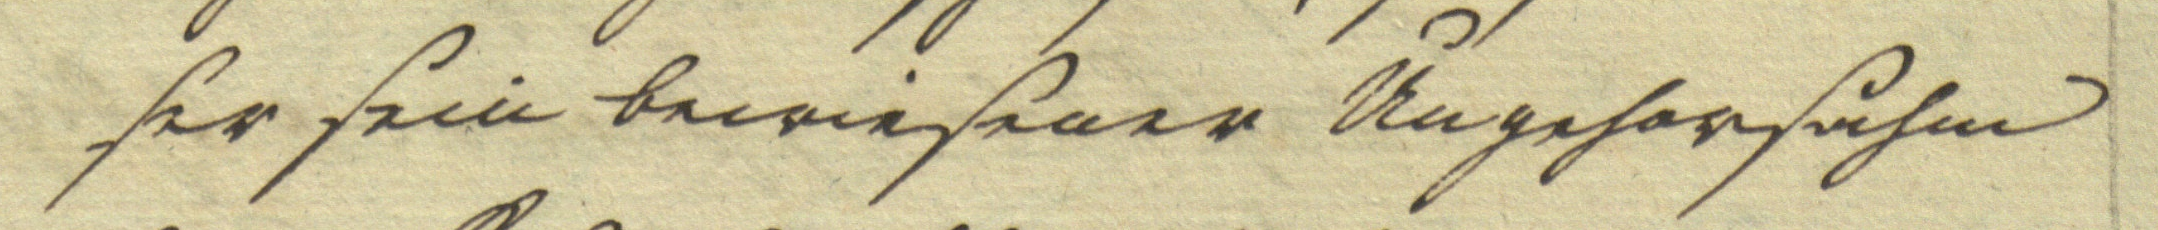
ser sein bewiesener Ungehorsahm
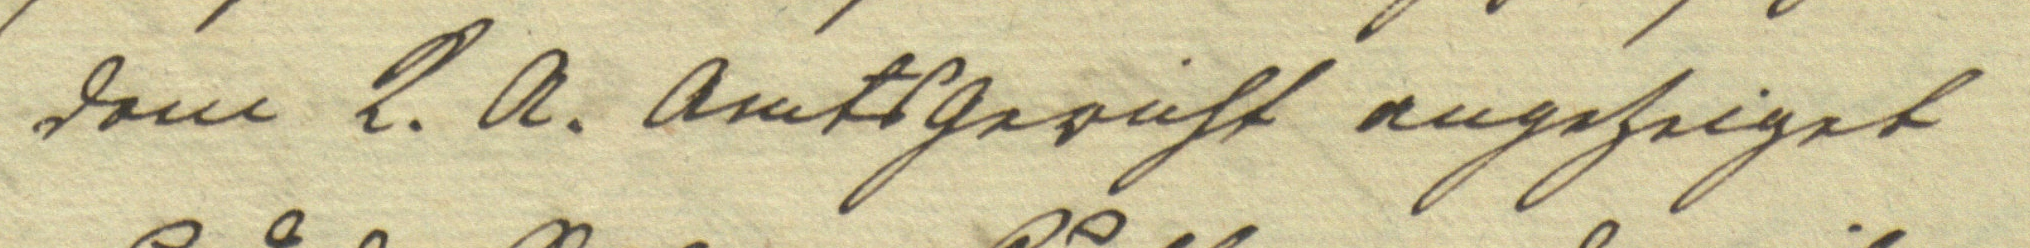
dem K. A. Amtsgericht angezeiget
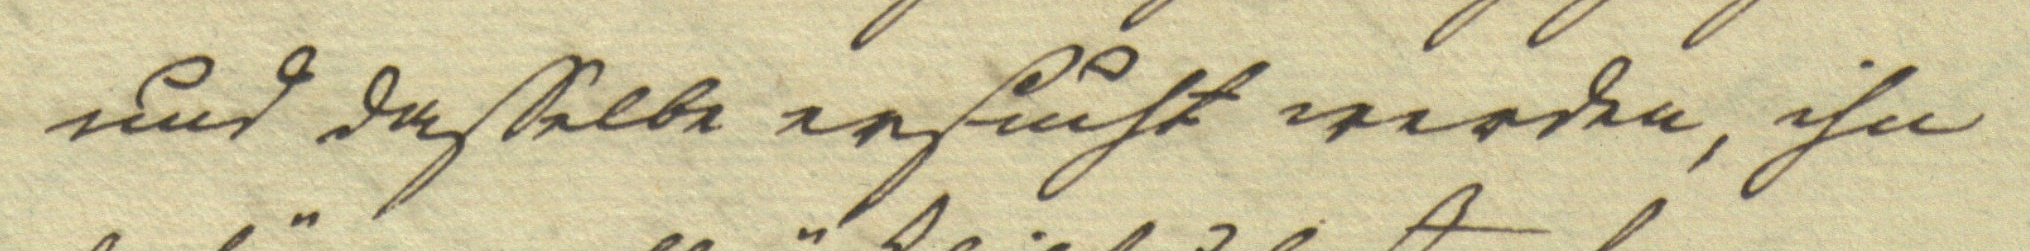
und dasselbe ersucht werden, ihn
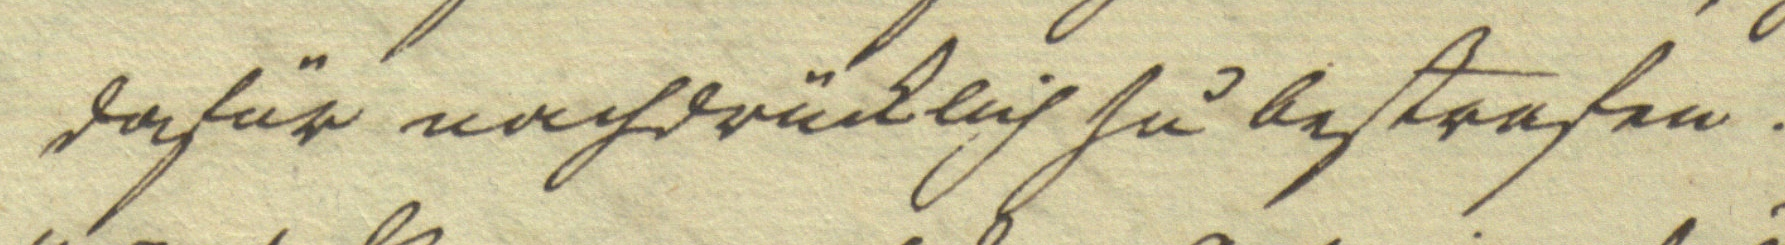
dafür nachdrücklich zu bestrafen.
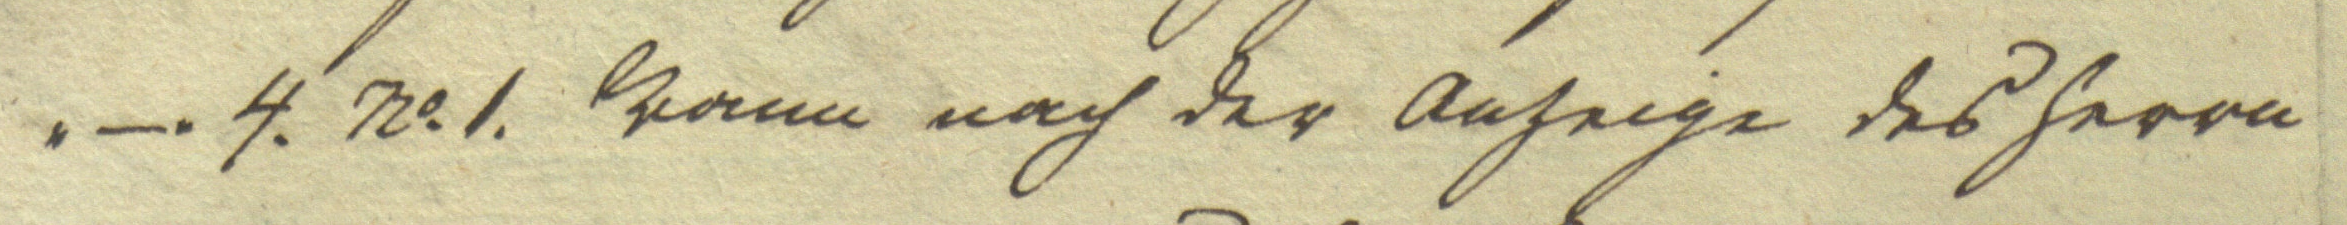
4. No 1. Wann nach der Anzeige des Herrn
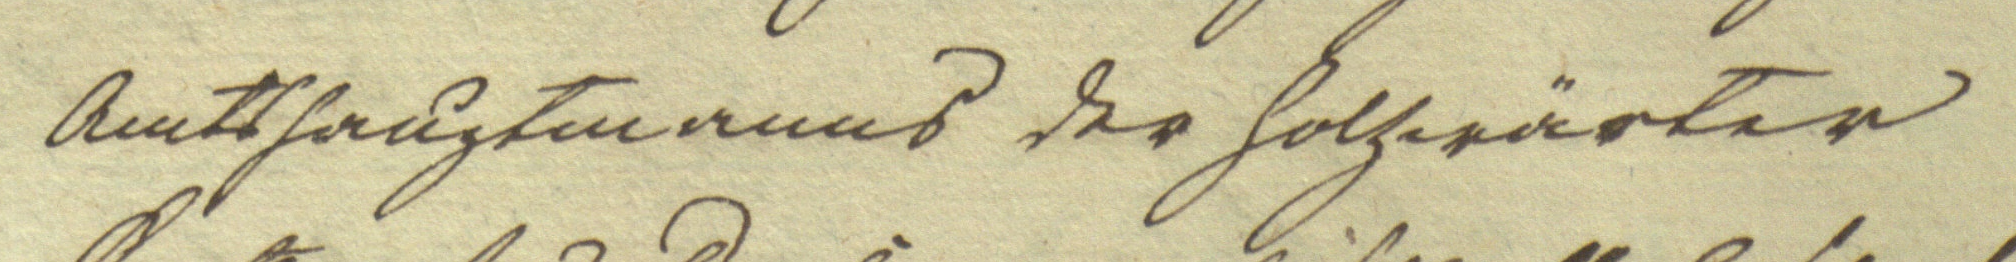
Amtshauptmanns der Holzwärter
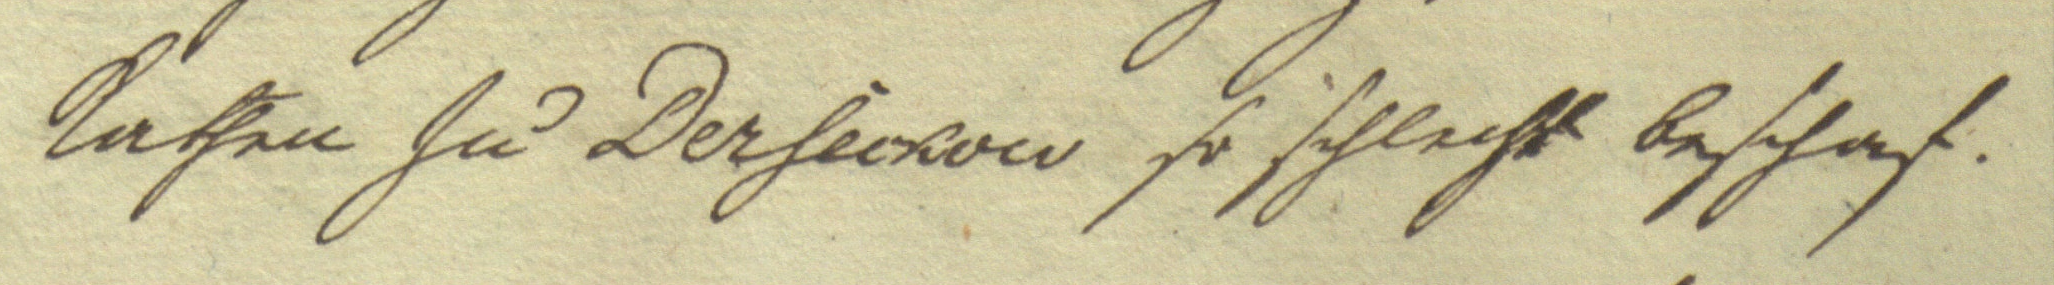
Kathen zu Derseckow so schlecht beschaf¬
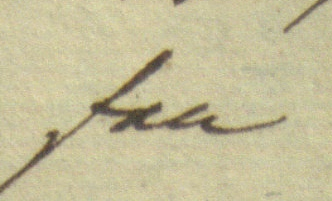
fen
